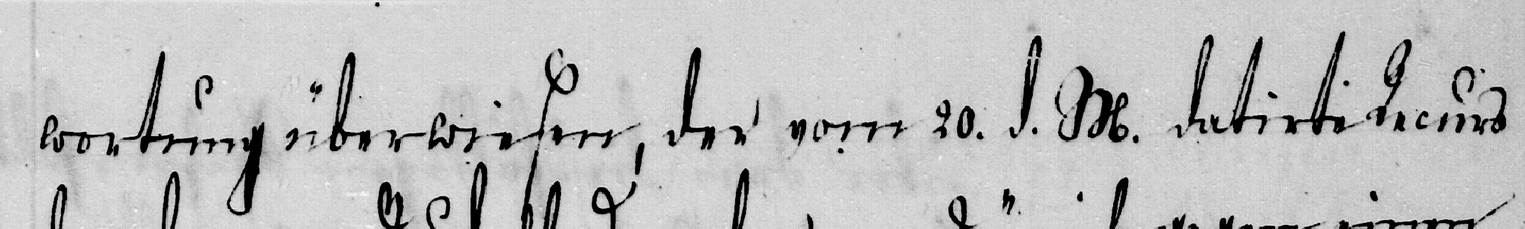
wortung überwiesen, der vom 20. d. M. datirte Recurs
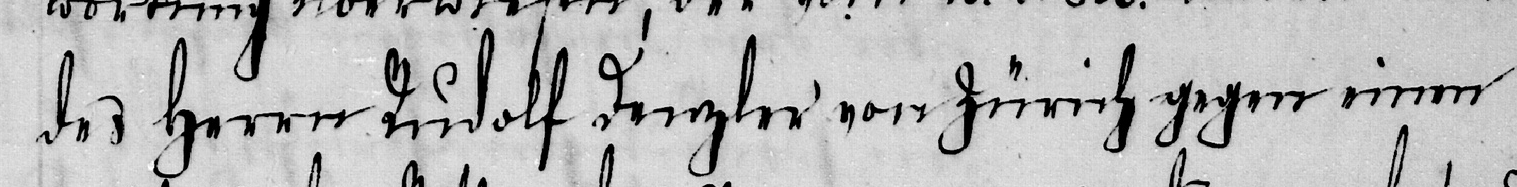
des Herrn Rudolf Denzler von Zürich gegen einen
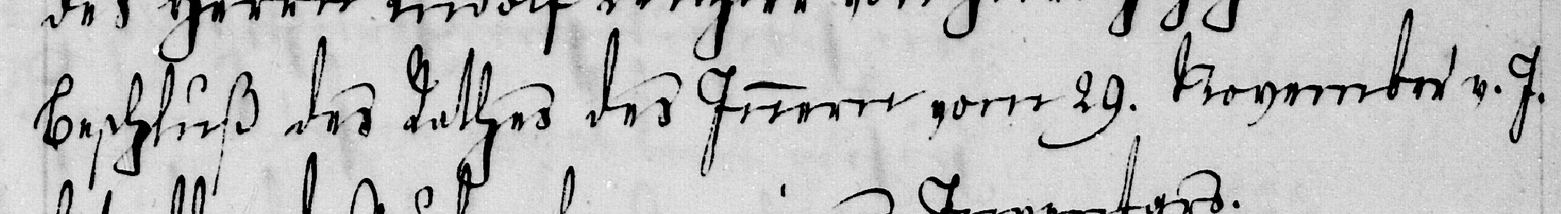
Beschluß des Rathes des Innern vom 29. November v. J.
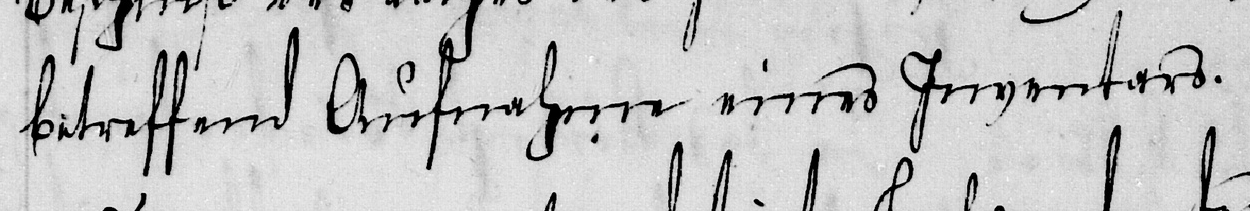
betreffend Aufnahme eines Inventars.
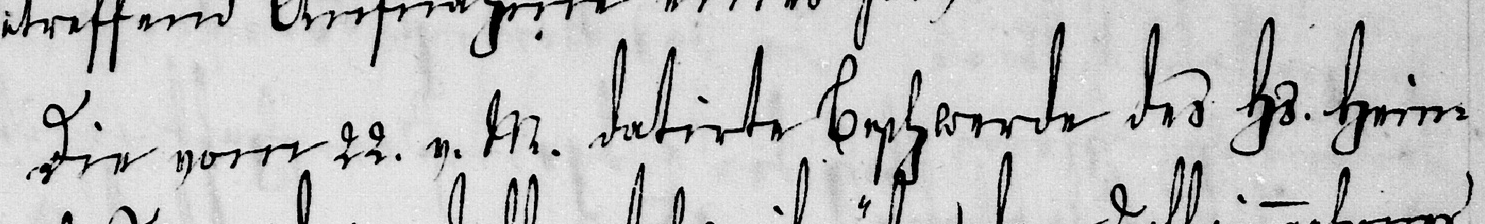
Die vom 22. v. M. datirte Beschwerde des Hs. Hein¬
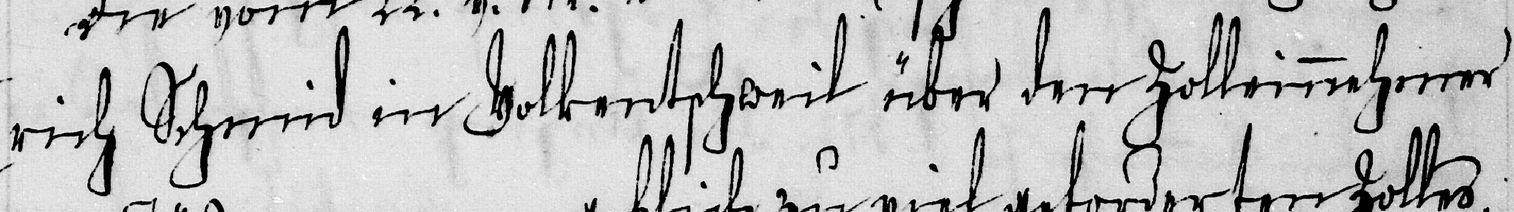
rich Schmid in Volkentschweil über den Zolleinnehmer
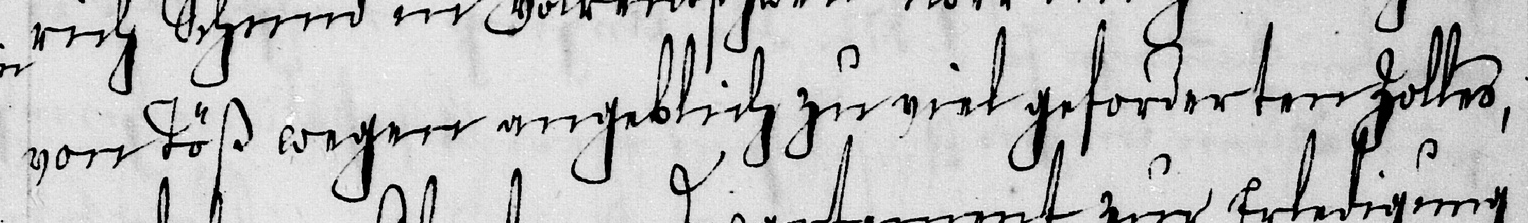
von Töß wegen angeblich zu viel geforderten Zolles,
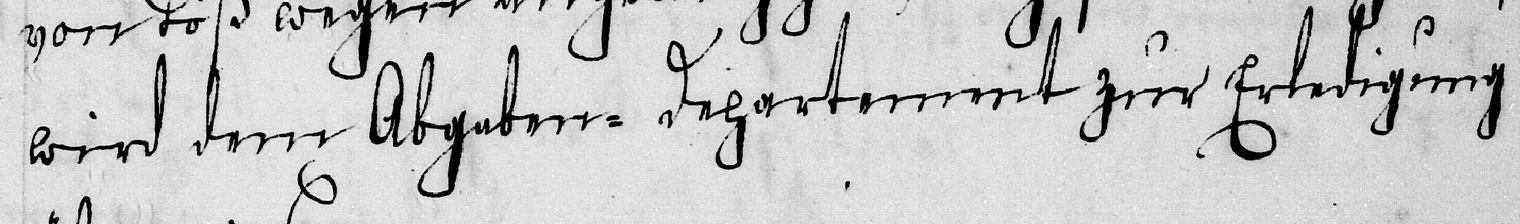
wird dem Abgaben-Departement zur Erledigung
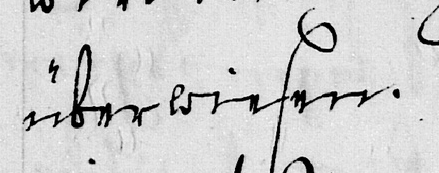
überwiesen.
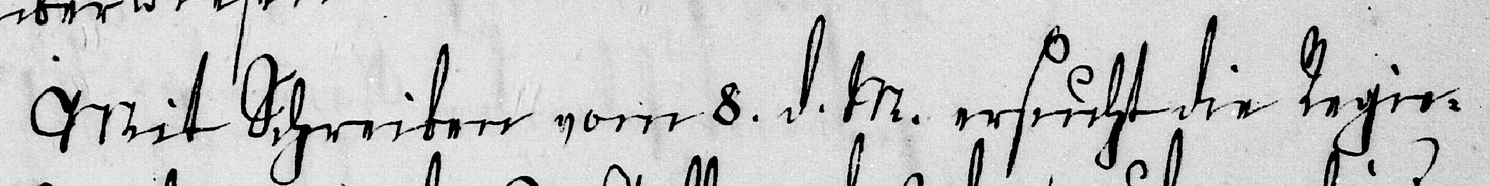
Mit Schreiben vom 8. d. M. ersucht die Regie¬
